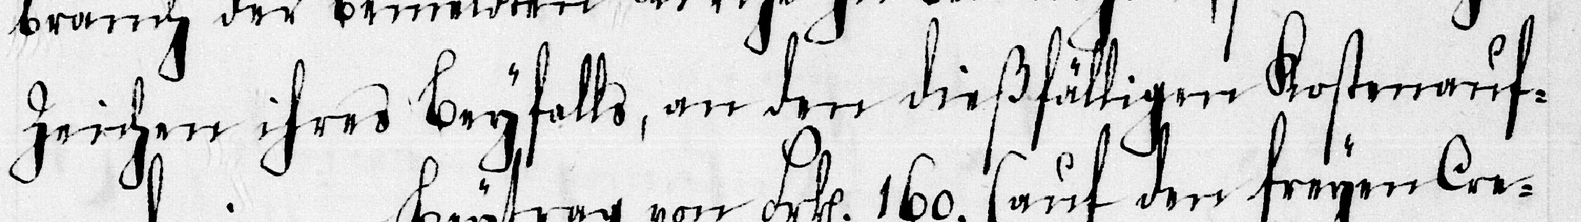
Zeichen ihres Beyfalls, an den dießfälligen Kostenauf¬
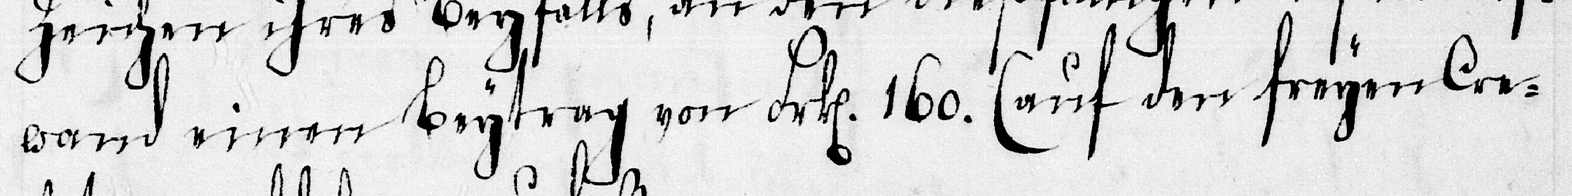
wand einen Beytrag von Frk[en]. 160. (auf den freyen Cre¬
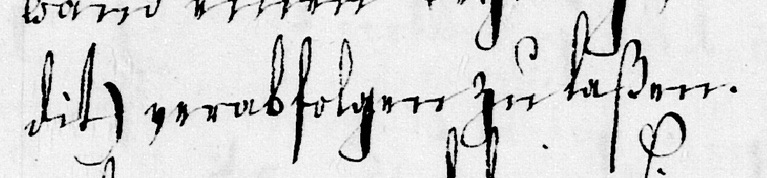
dit) verabfolgen zu laßen.
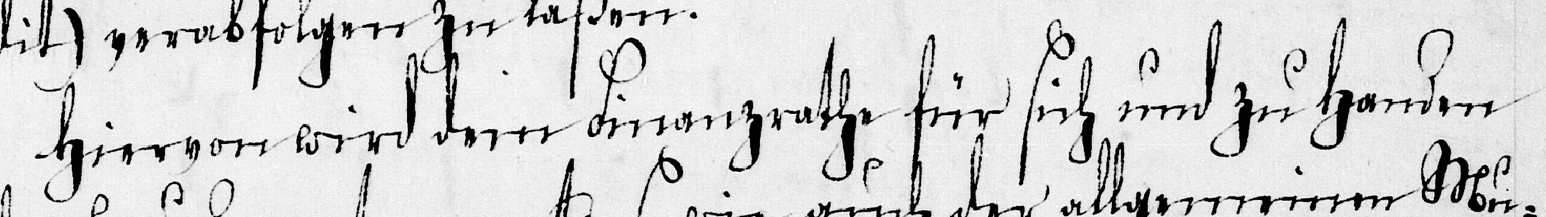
Hiervon wird dem Finanzrathe für sich und zu Handen
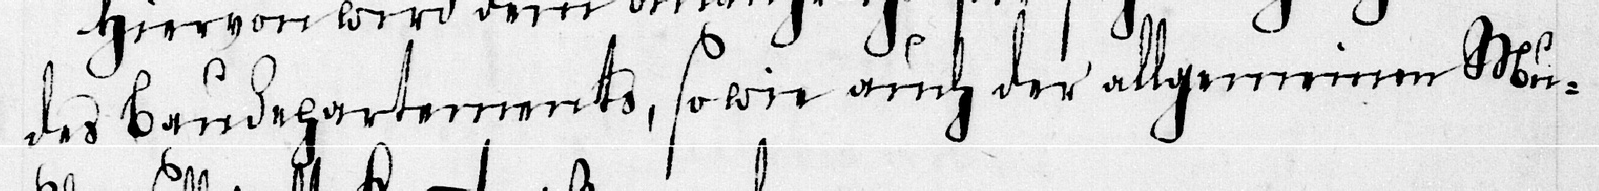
des Baudepartements, sowie auch der allgemeinen Musi¬
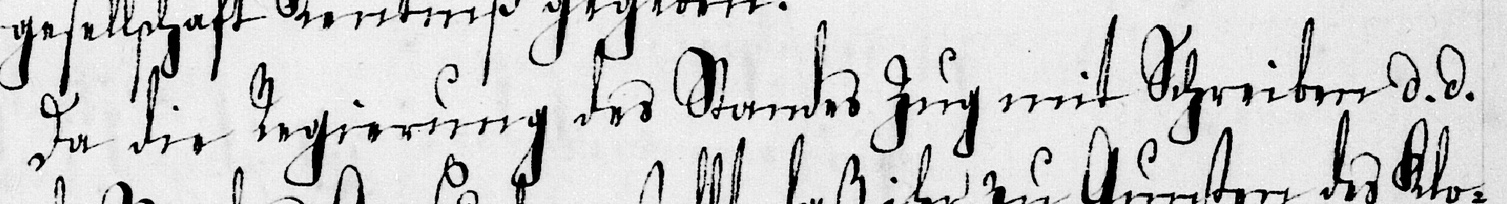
Da die Regierung des Standes Zug mit Schreiben d. d.
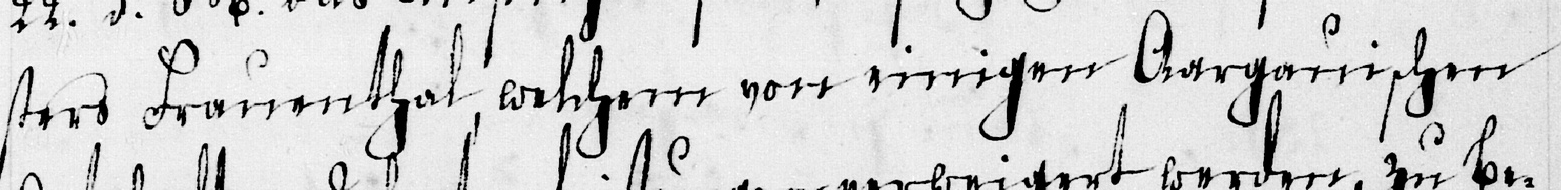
ters Frauenthal, welchem von einigen Aargauischen
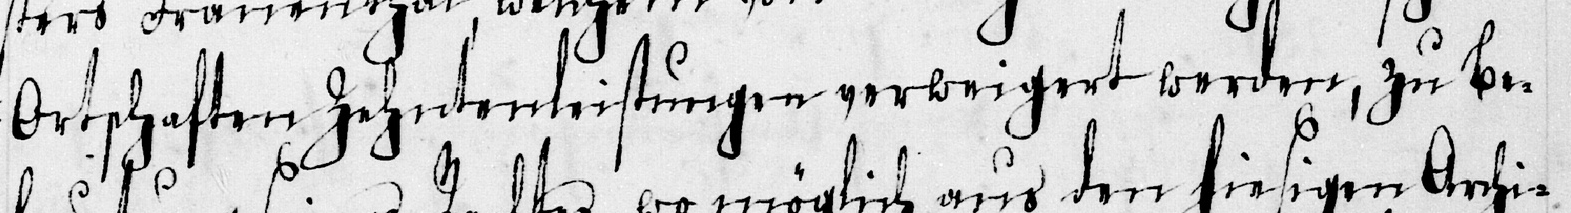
Ortschaften Zehntenleistungen verweigert werden, zu Be¬
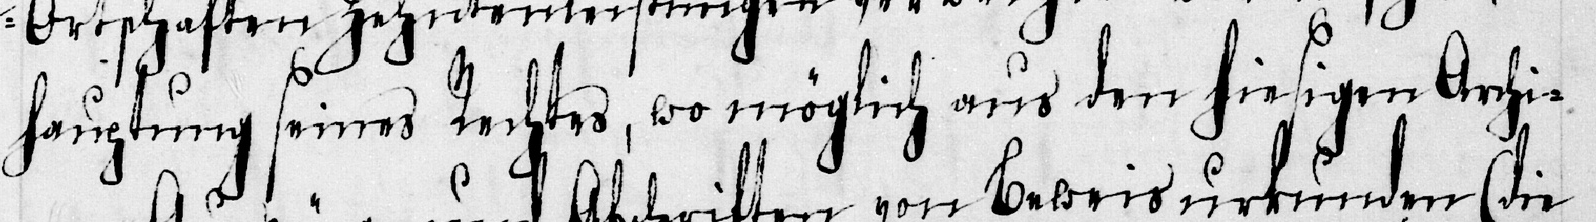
hauptung seines Rechtes, wo möglich aus den hiesigen Archi¬
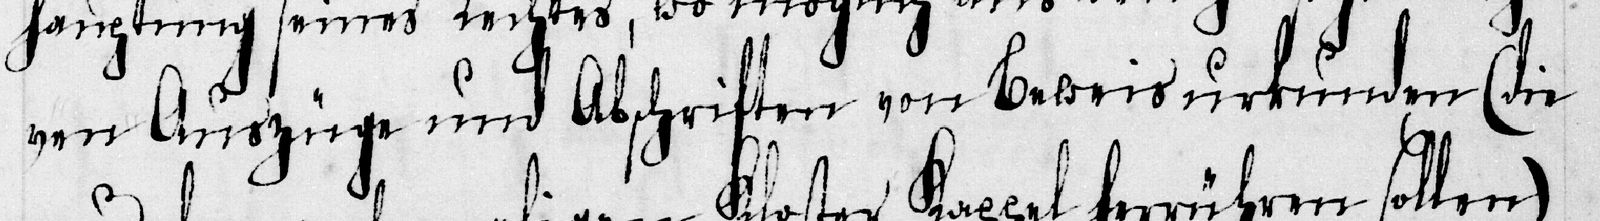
ven Auszüge und Abschriften von Beweisurkunden (die
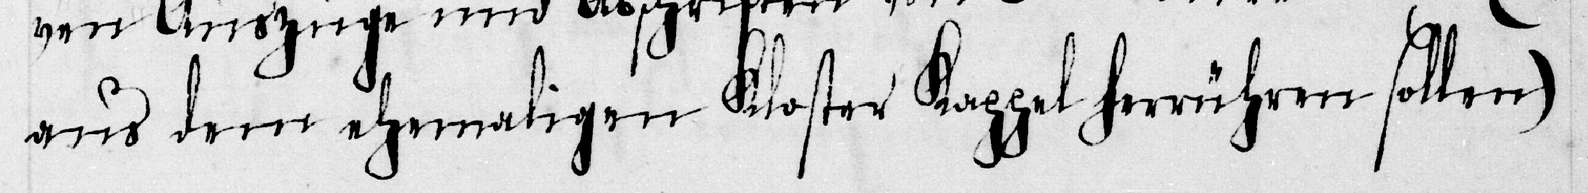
aus dem ehemaligen Kloster Kappel herrühren sollen)
